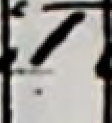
I
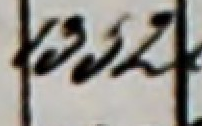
1352
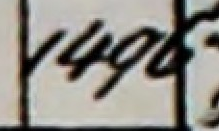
1490
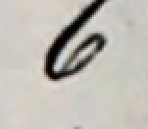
6
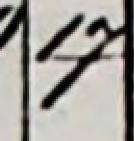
17
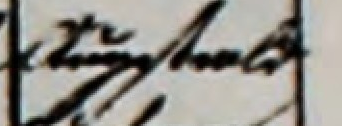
Augstwald
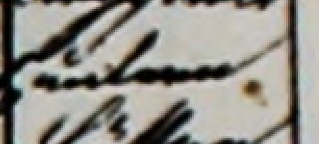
untern
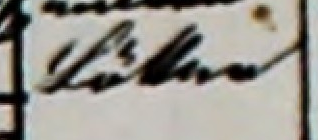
Lötter
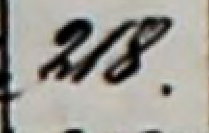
218
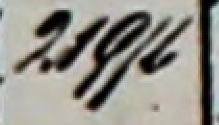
219/6
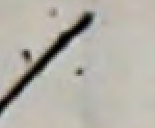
./.
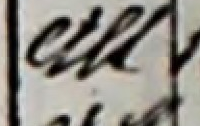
Alt
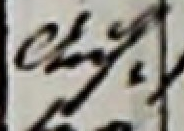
Aus„
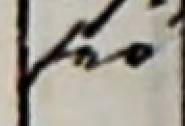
see
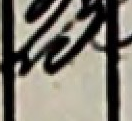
23
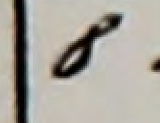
8
